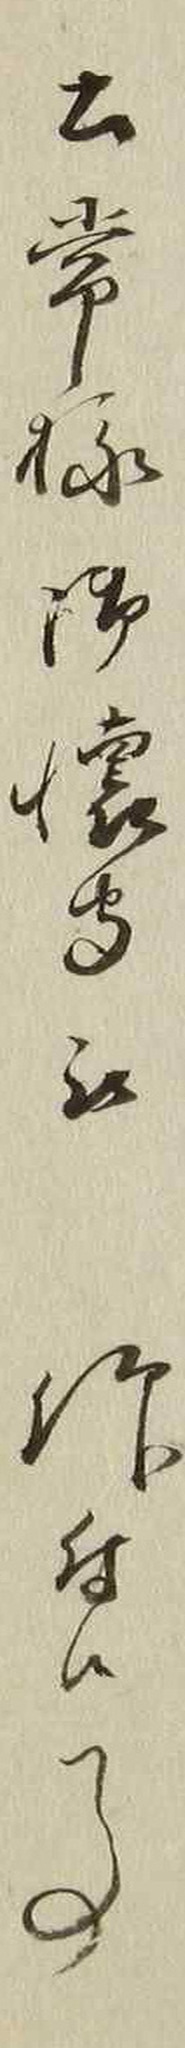土常様御懐守被仰付候事
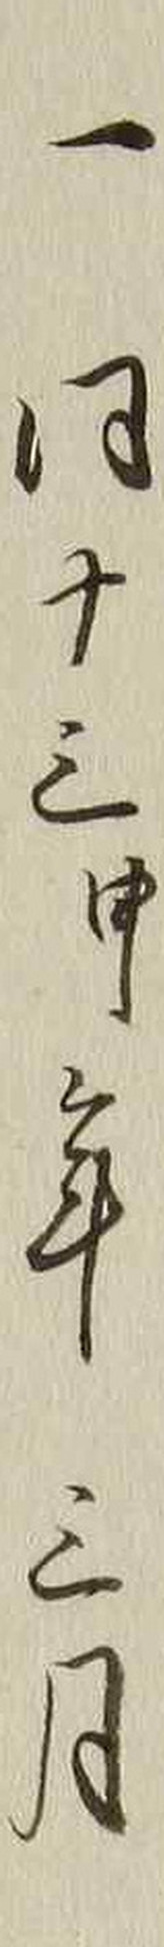一同十三申年三月
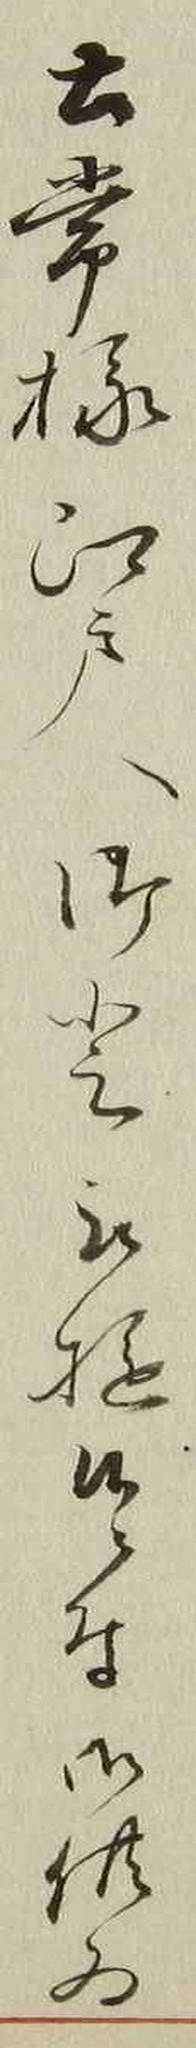土常様江戸へ御登被遊候ニ付御供為
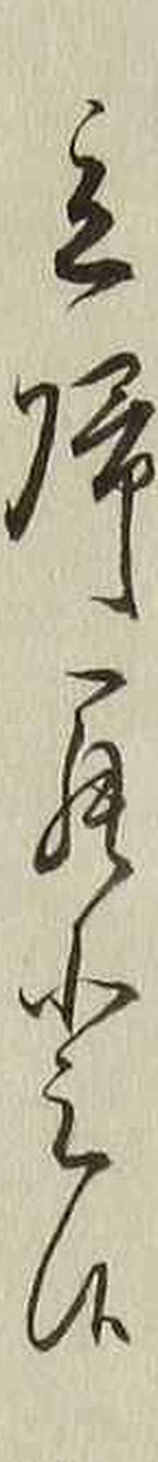立帰罷登候
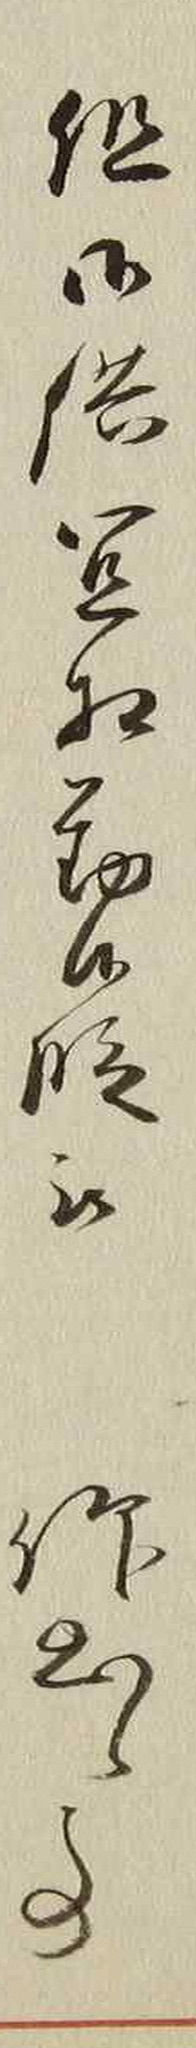但御供宜相勤候段被仰出候事
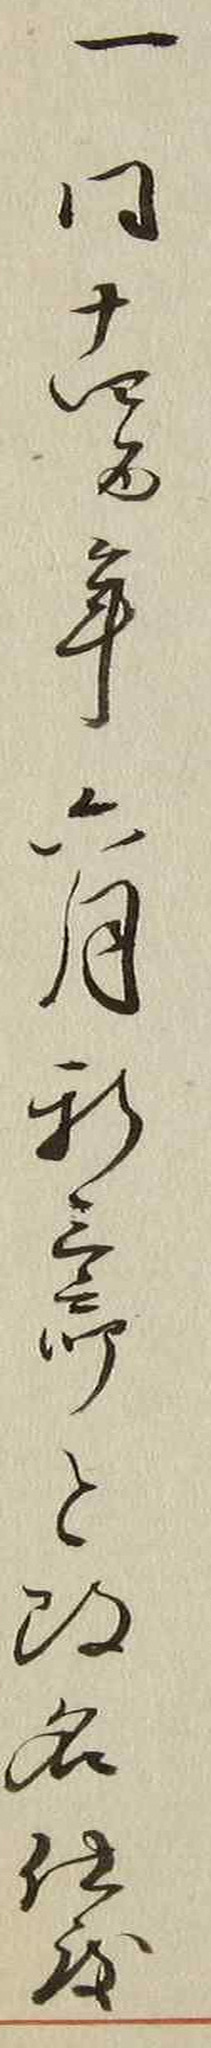一同十四酉年六月新三郎と改名仕度
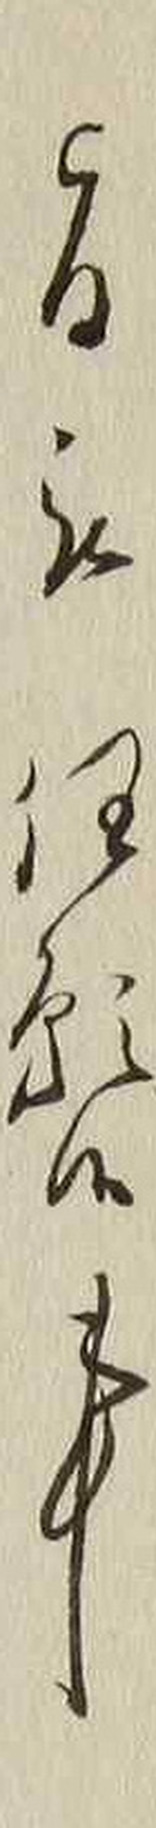旨被任願候事
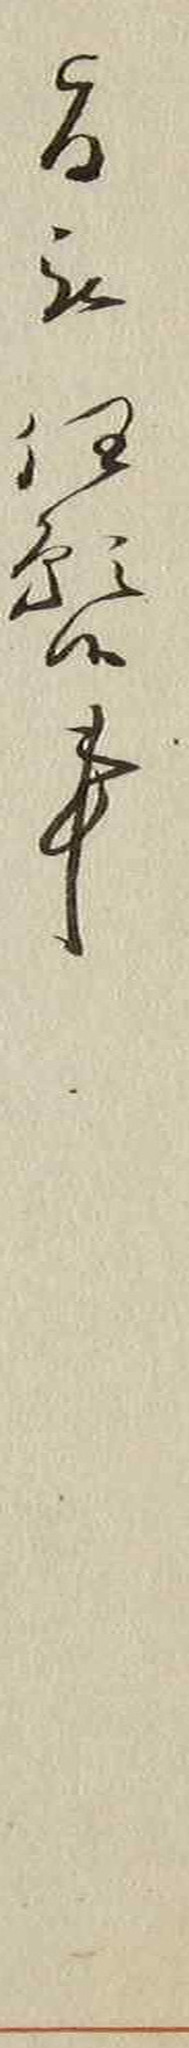旨被任願候事
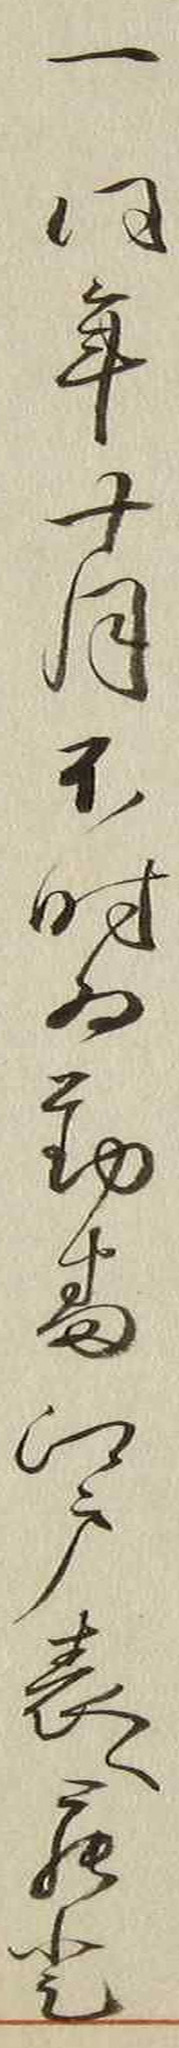一同年十月不時為勤番江戸表へ罷登
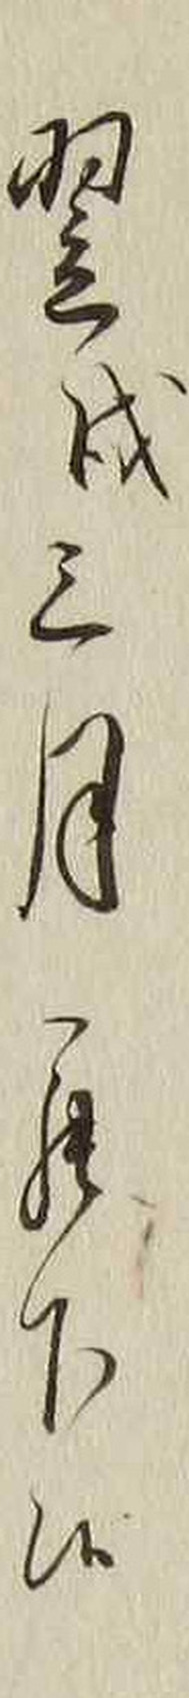翌戌三月罷下候
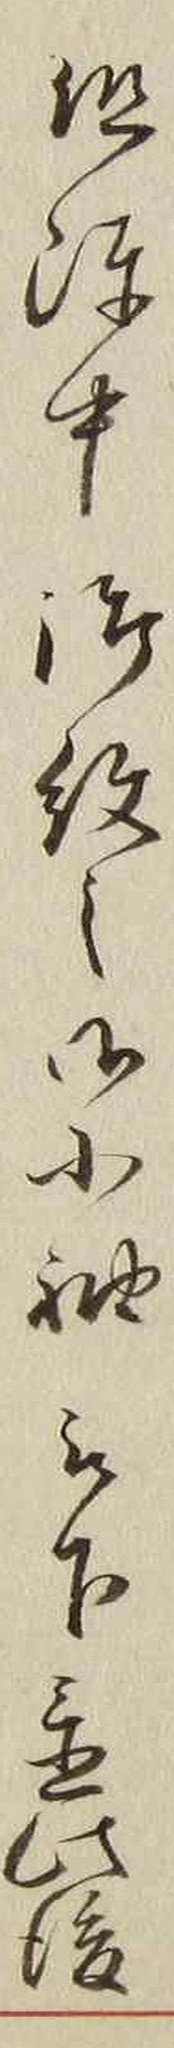但陣中御紋之御小袖被下置此後
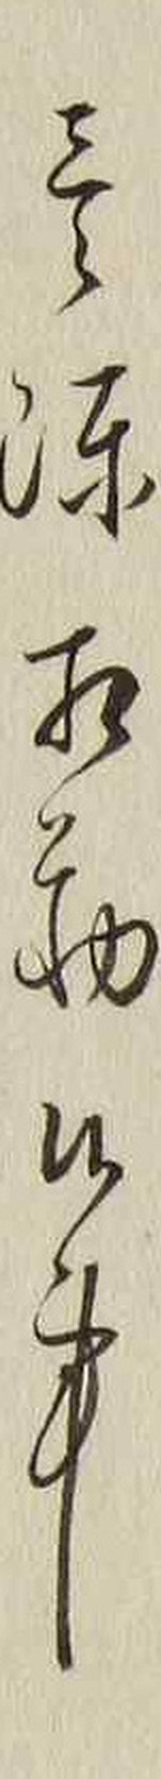壱陣相勤候事
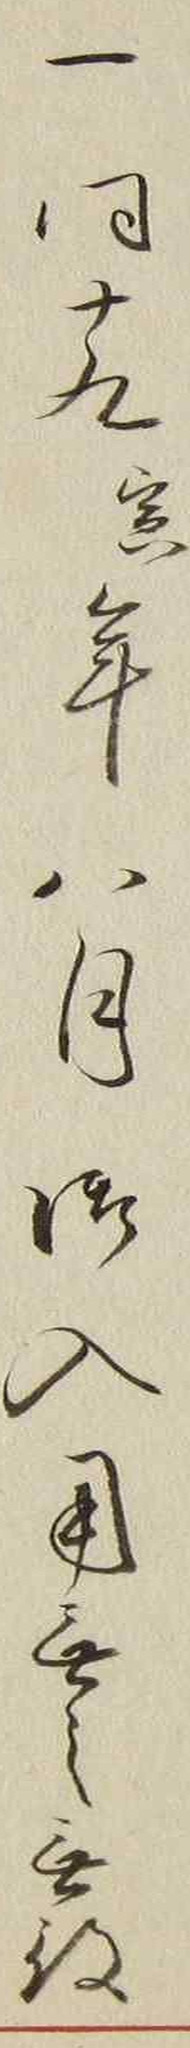一同十九寅年八月御入用無之無役
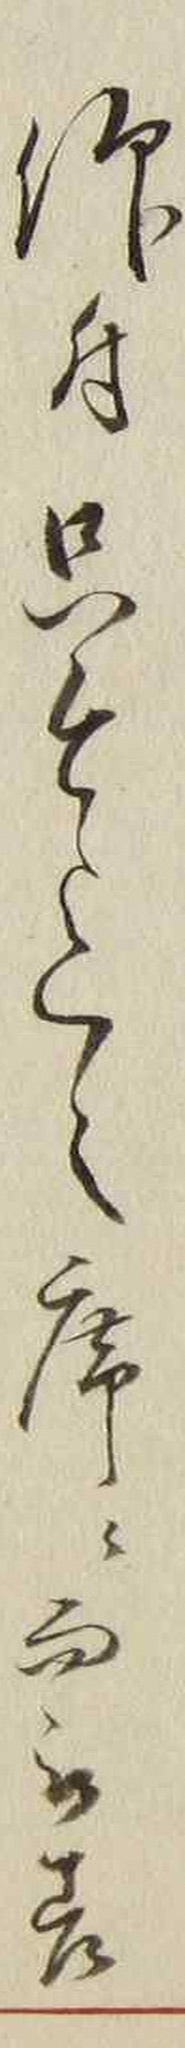被仰付只今迄之席ニ而被差

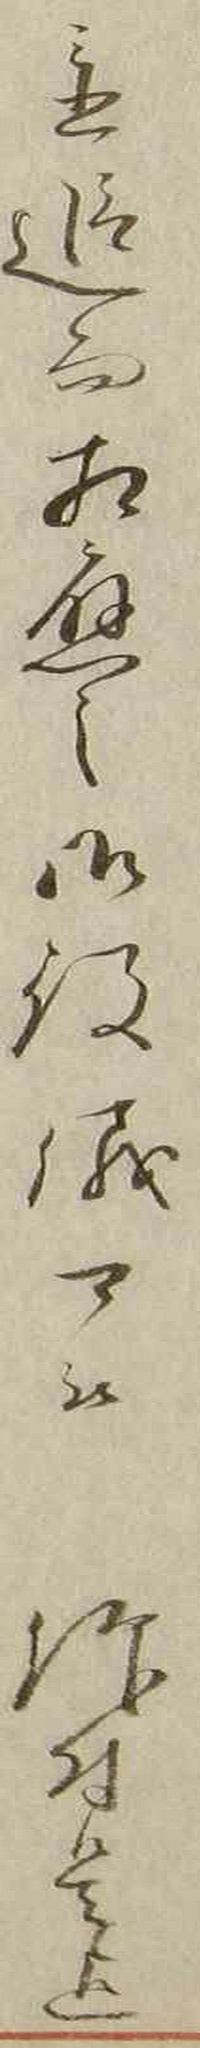置追而相応之御役儀可被仰付是迄
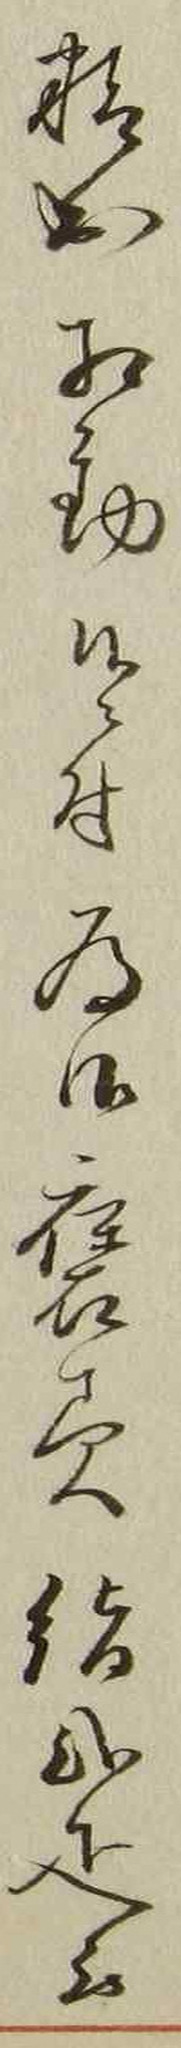精出相勤候ニ付為御褒美絹弐疋被
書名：諸士系譜　巻之28　い之部28
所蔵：会津若松市立会津図書館
